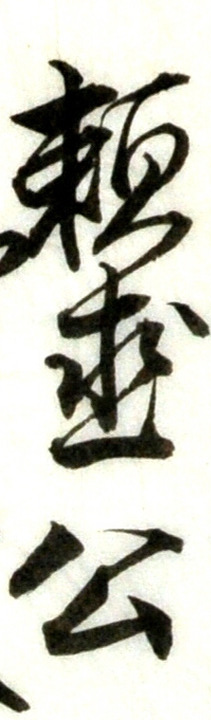頼直公
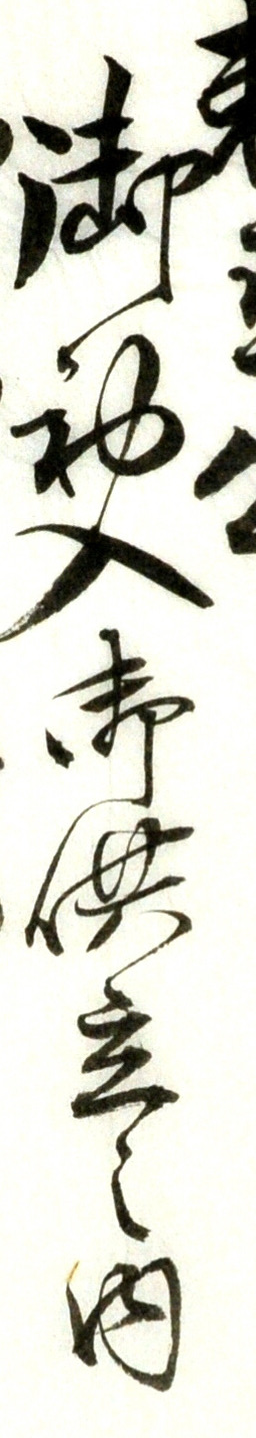御初入御供立之内
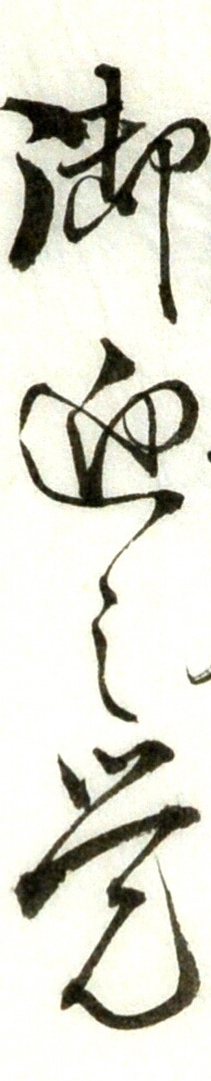御迎之覚

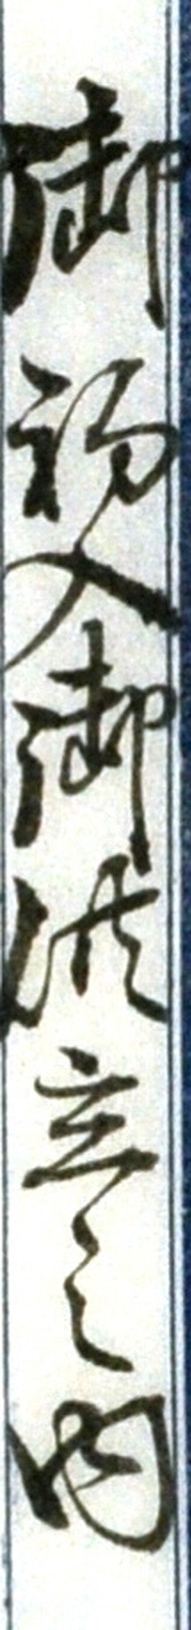御初入御供立之内
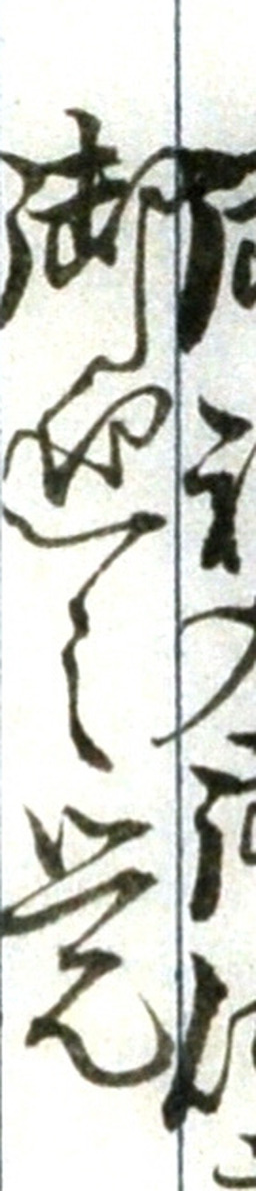御迎之覚
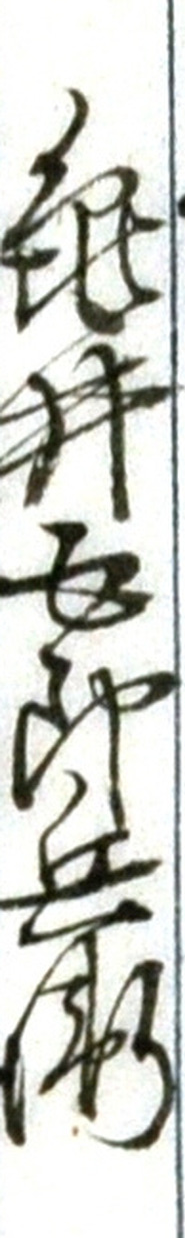亀井五郎兵衛
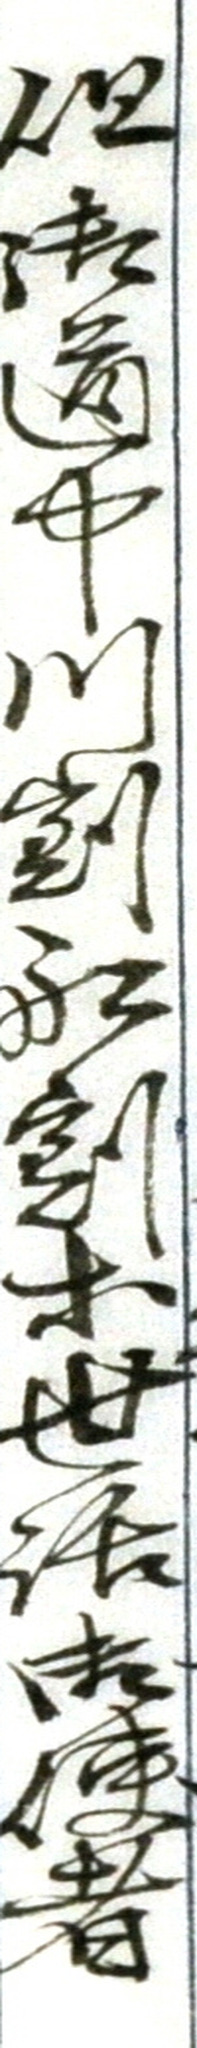但御道中川割船割等世話御使者
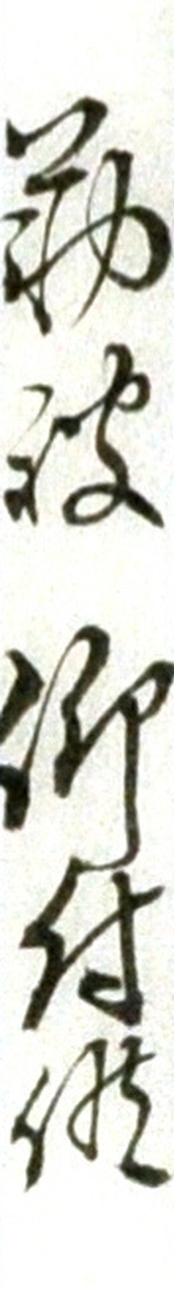勤被仰付候

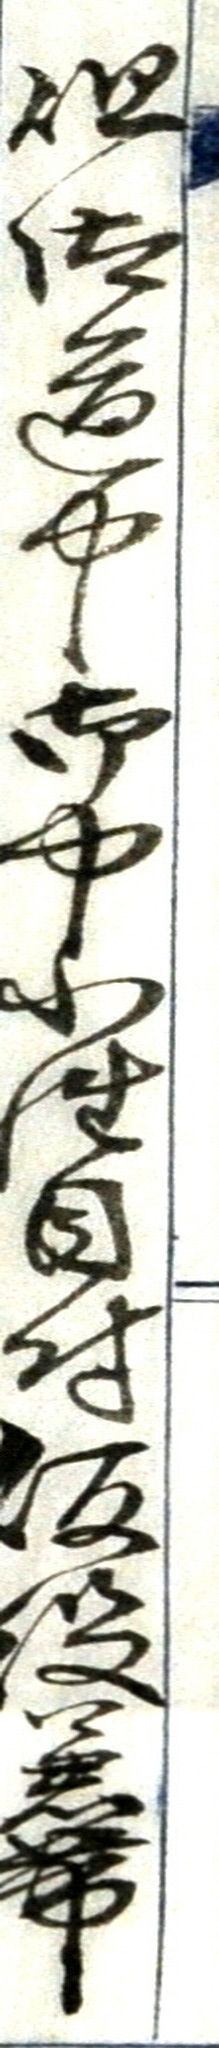但御道中御中小性目付仮役兼帯
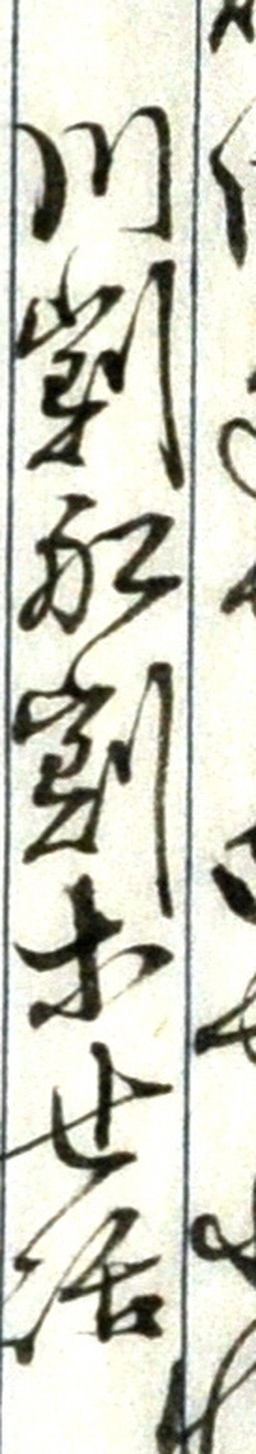川割船割等世話
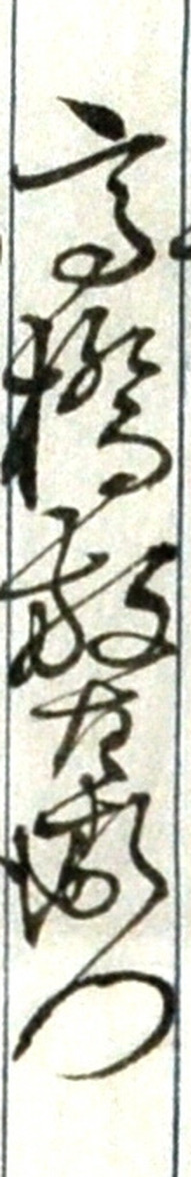高橋放左衛門
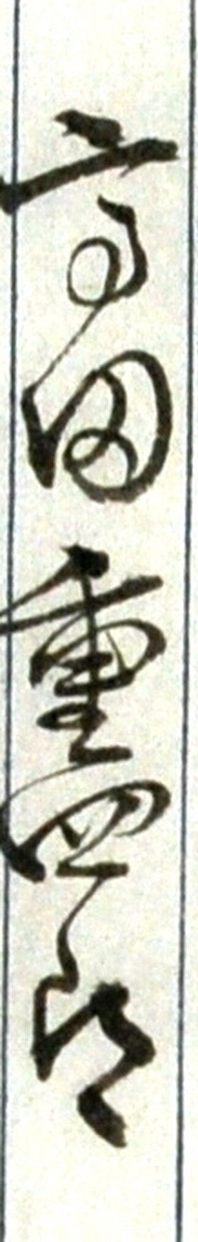高田重四郎
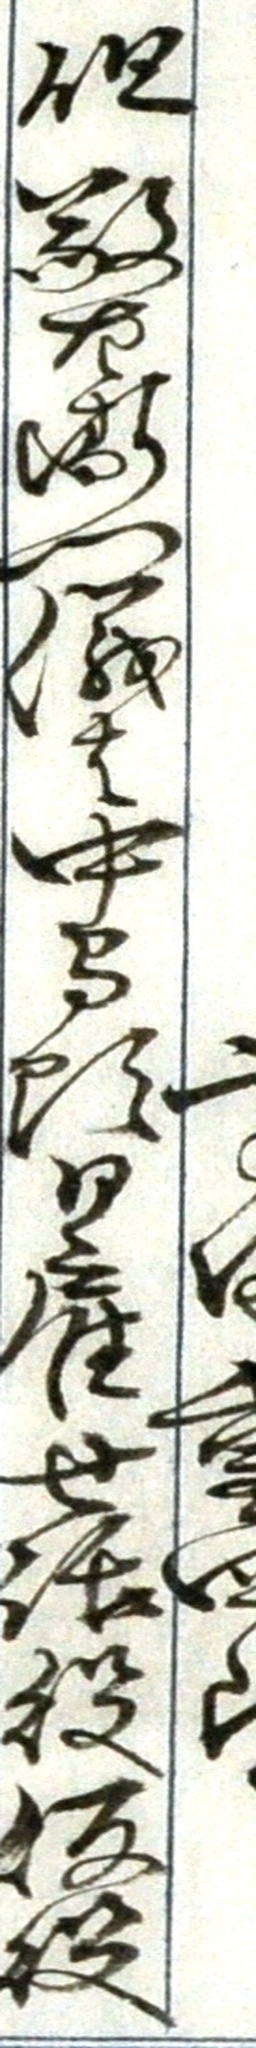但敬左衛門儀者中間頭日雇世話役仮役
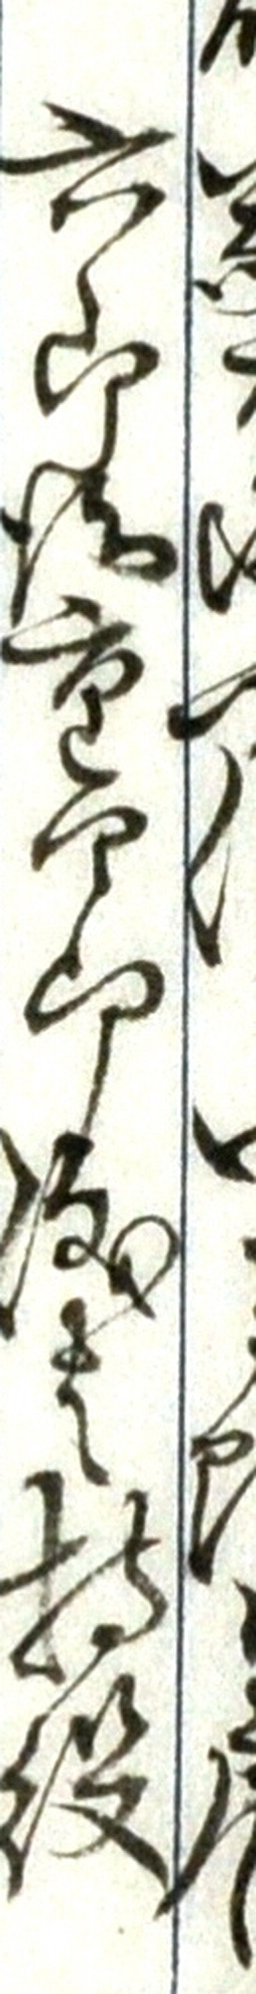六郎治重四郎儀者持役
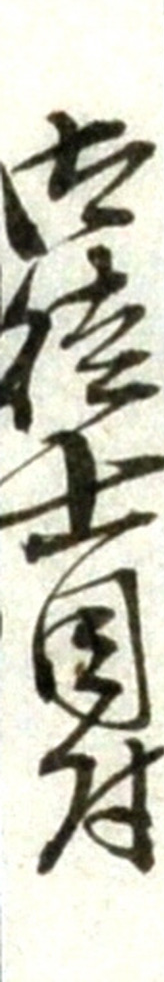御徒士目付
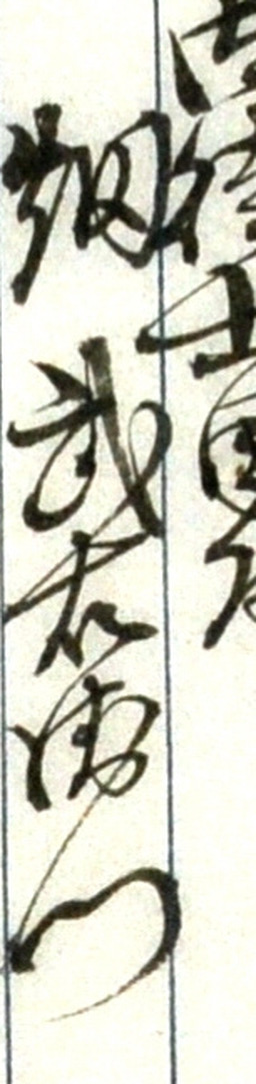畑武右衛門
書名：頼直公御初入御供立之内御迎之覚
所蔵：伊那市立高遠町図書館・合同会社AMANE
